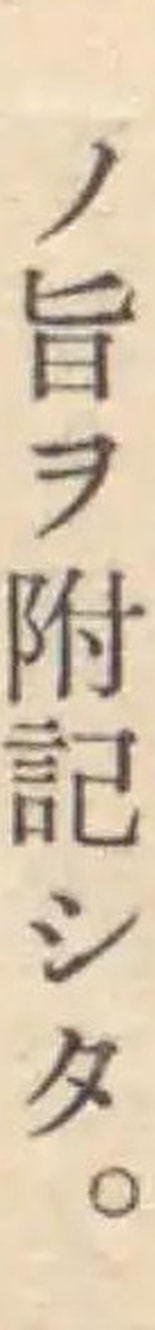ノ旨ヲ附記イタ。
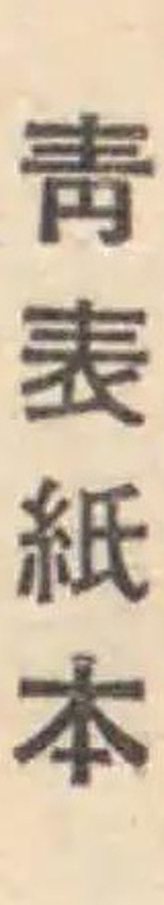青表紙本
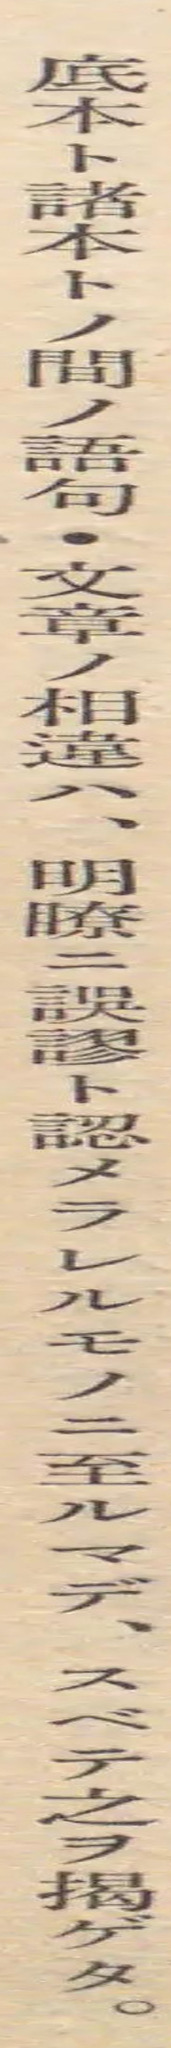一底本ト諸本トノ間ノ語句・文章ノ相違ハ、明瞭ニ誤謬ト認メラレルモノニ至ルマデ、スベテ之ヲ掲ゲタ。
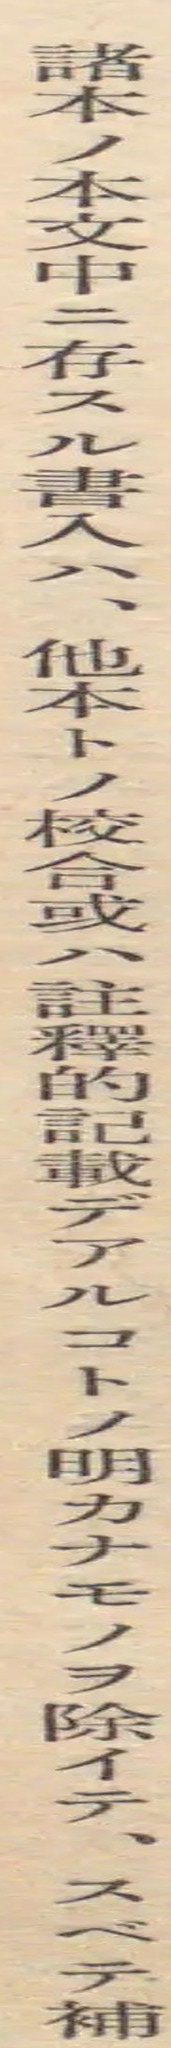一諸本ノ本文中ニ存スル書入ハ、他本トノ校合或ハ註釈的記載デアルコトノ明カナモノヲ除イテ、スベテ補
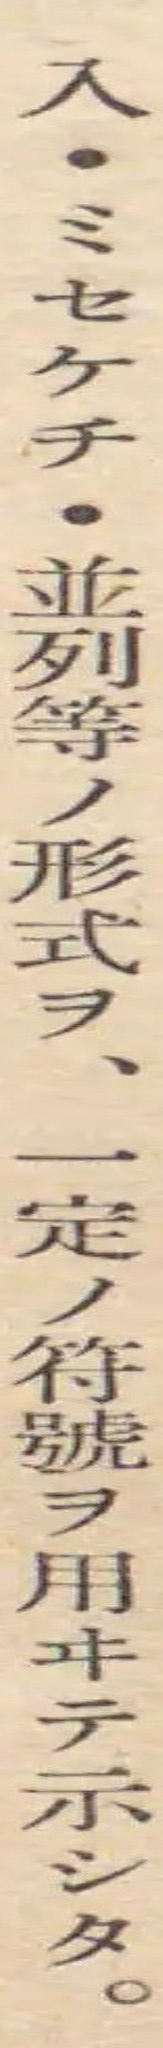入・ミセケチ・並列等ノ形式ヲ、一定ノ符号ヲ用ヰテ示シタ。
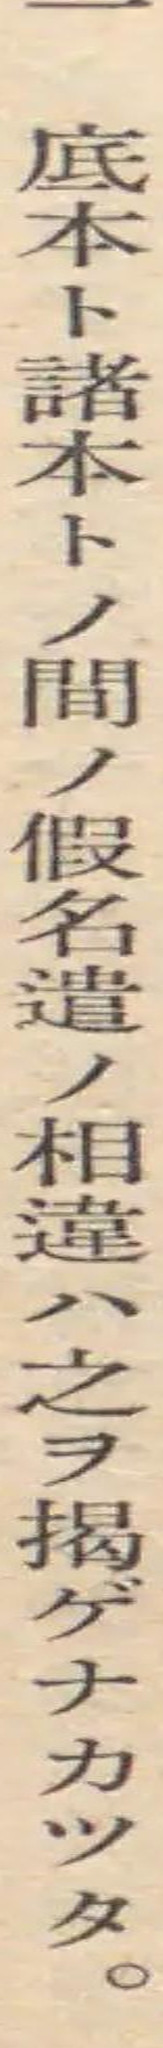一底本ト諸本トノ間ノ仮名遣ノ相違ハ之ヲ掲ゲナカツタ。
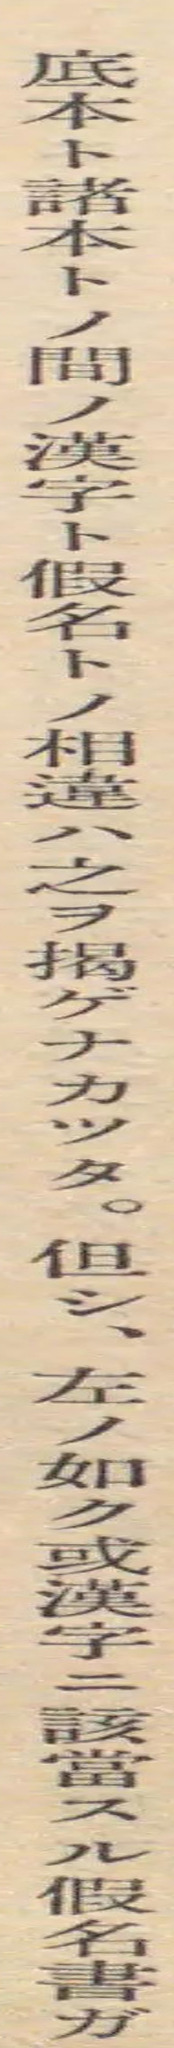一底本ト諸本トノ間ノ漢字ト仮名トノ相違ハ之ヲ掲ゲナカツタ。但シ、左ノ如ク或漢字ニ該当スル仮名書ガ
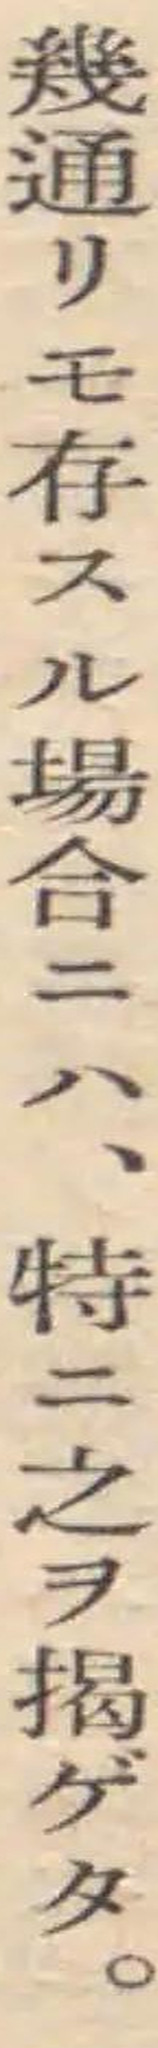幾通リモ存スル場合ニハ、特ニ之ヲ掲ゲタ。
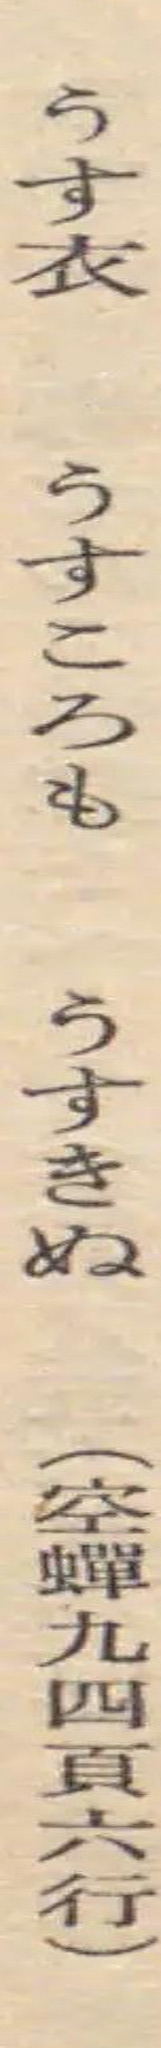うす衣うすころもうすきぬ(空蝉九四頁六行)

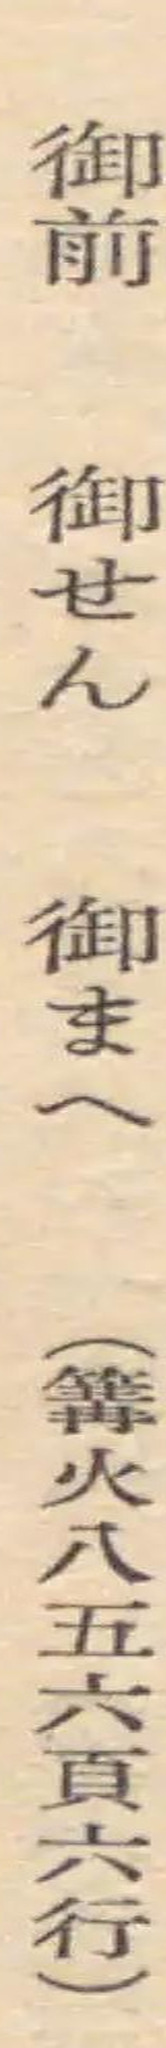御前御せん御まへ(篝火八五六頁六行)
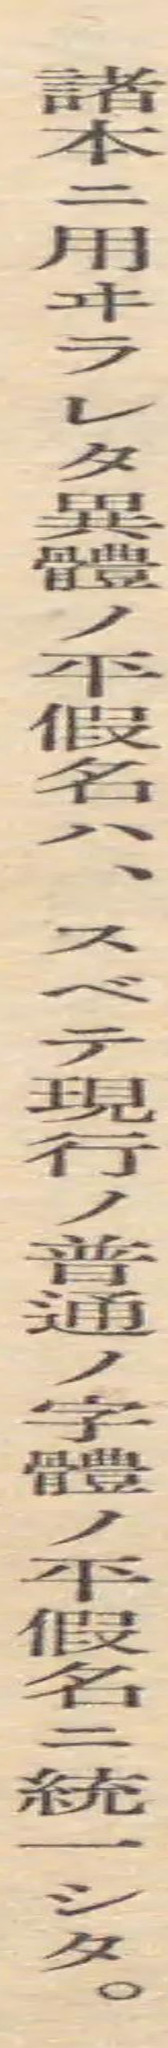一諸本ニ用ヰラレタ異体ノ平仮名ハ、スベテ現行ノ普通ノ字体ノ平仮名ニ統一シタ。
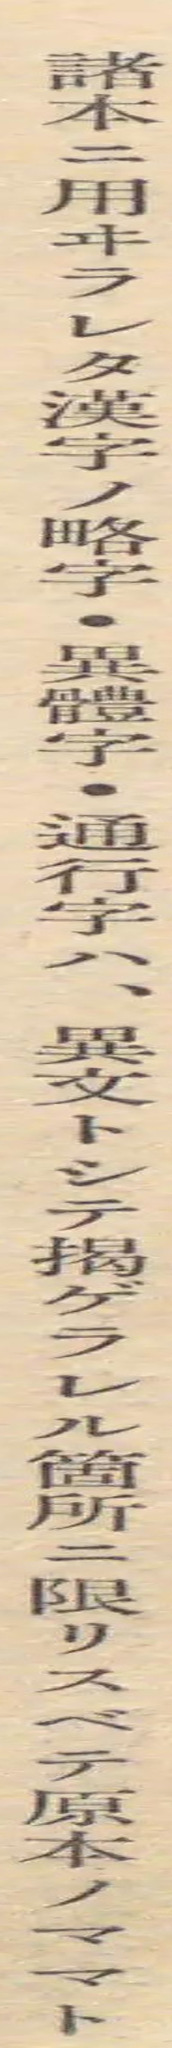一諸本ニ用ヰラレタ漢字ノ略字・異体字・通行字ハ、異文トシテ掲ゲラレル箇所ニ限リスベテ原本ノママト
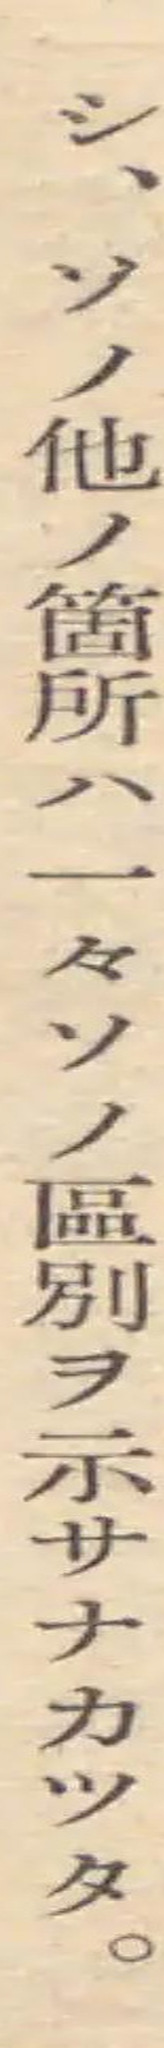シ、ソノ他ノ箇所ハ一々ソノ区別ヲ示サナカツタ。
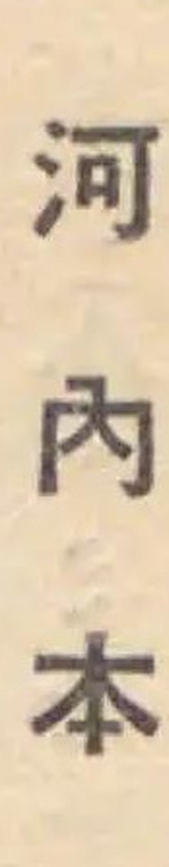河内本
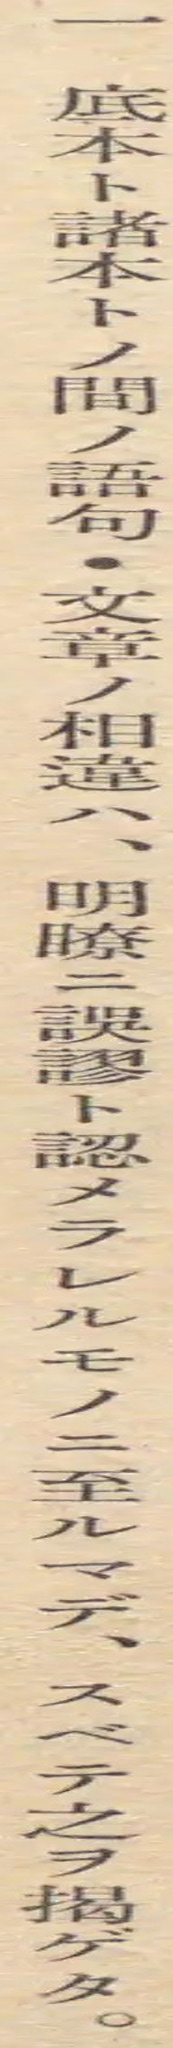一底本ト諸本トノ間ノ語句・文章ノ相違ハ、明瞭ニ誤謬ト認メラレルモノニ至ルマデ、スベテ之ヲ掲ゲタ。
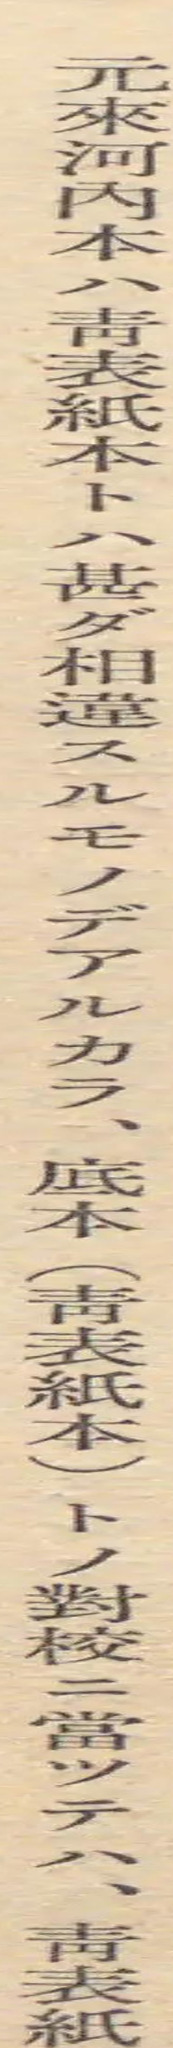一元来河内本ハ青表紙本トハ甚ダ相違スルモノデアルカラ、底本(青表紙本)トノ対校ニ当ツテハ、青表紙
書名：校異源氏物語.
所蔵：国立国会図書館 National Diet Library, JAPAN
